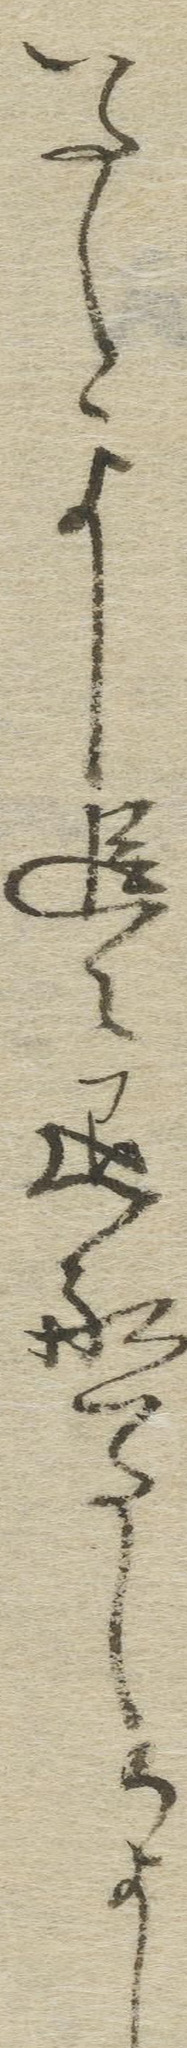いたし候よし追々退船いたし候よし
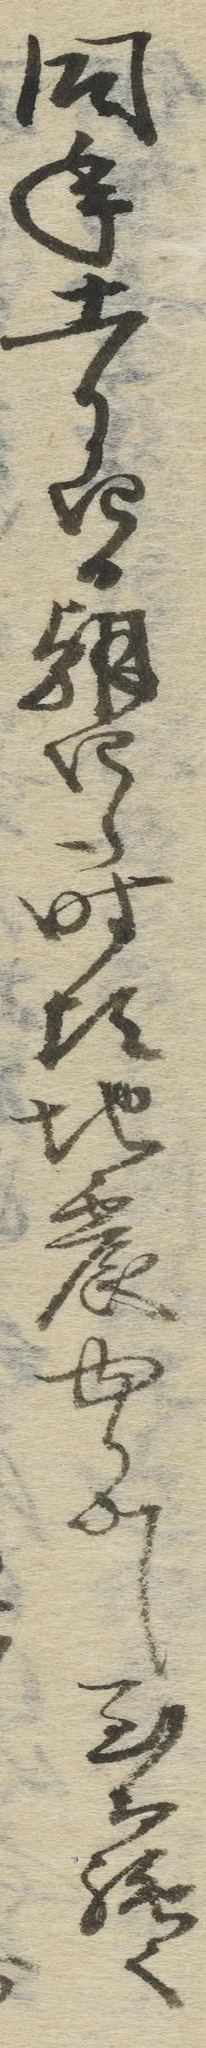同年十一月四日朝四ッ時頃地震ゆり出し至而強く
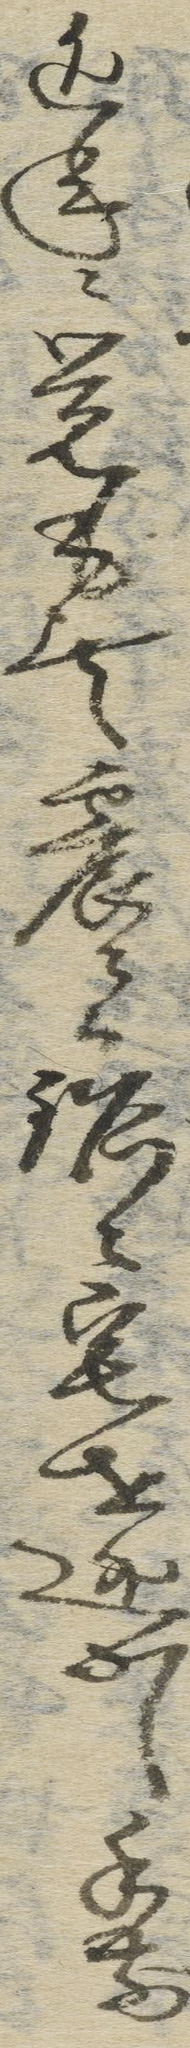近年二覚も無之震二候銘々宅を逃出し年寄
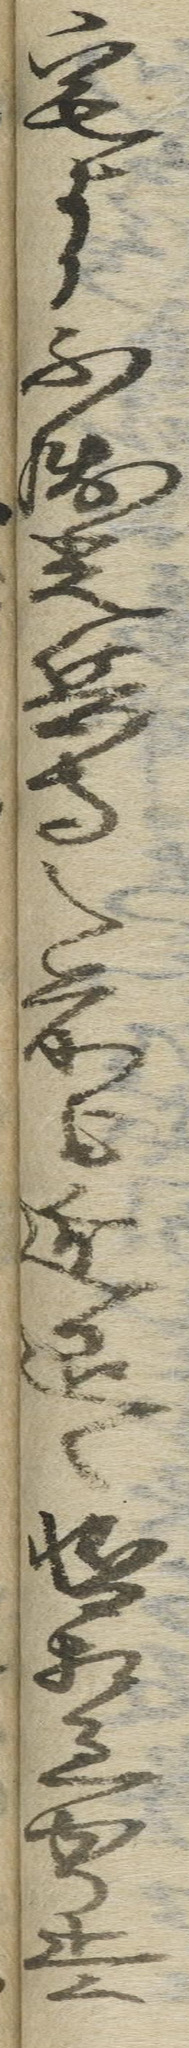宅より不残光岳寺之前江逃退候暫相過ゆり止ム
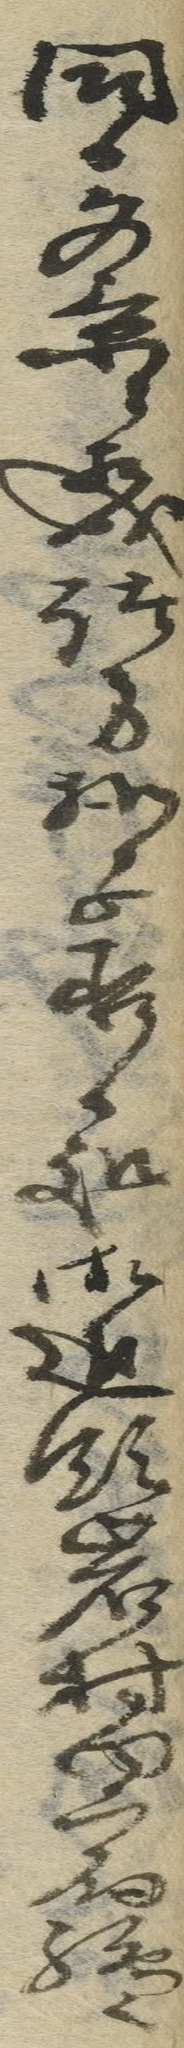同日夕参相成侍方様ゟ承候処御近領岩村田宿強く
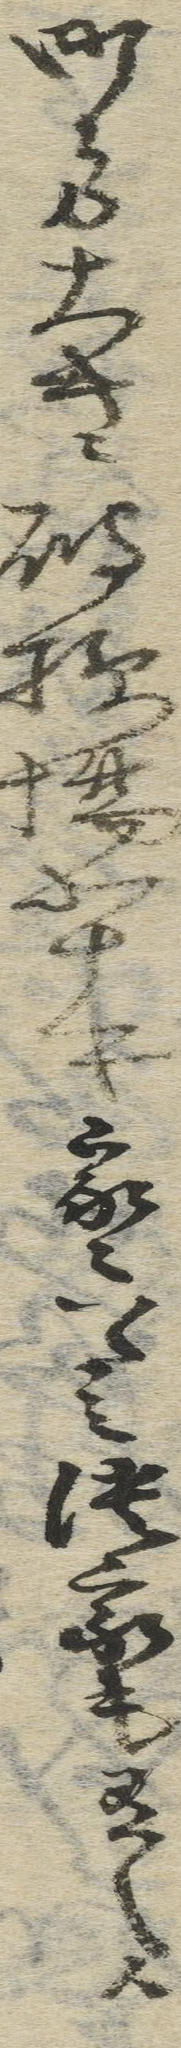町方大キ二破損場出来家々いたミ潰家も有之候
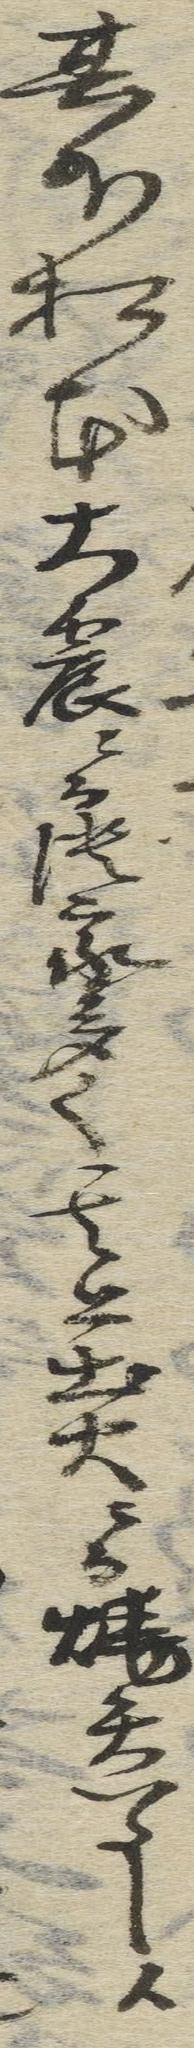其外松本大震二而潰家多く其上出火二而焼失いたし候
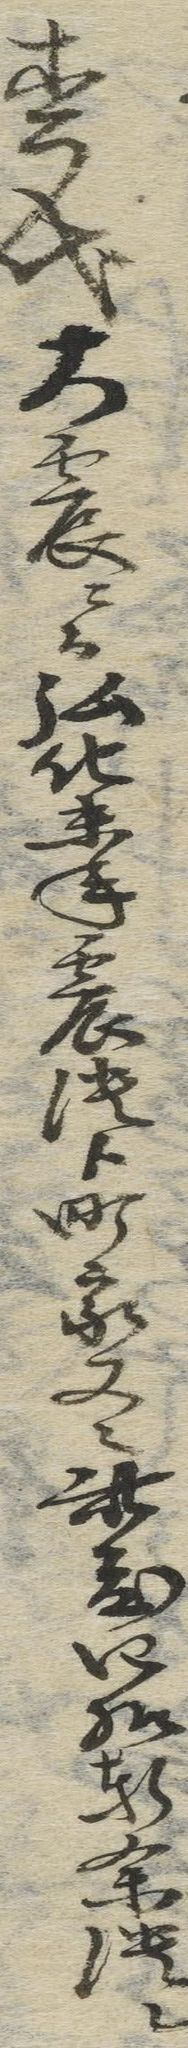枩代大震二而弘化未年震潰候町家又々此度四拾軒余潰ㇱ
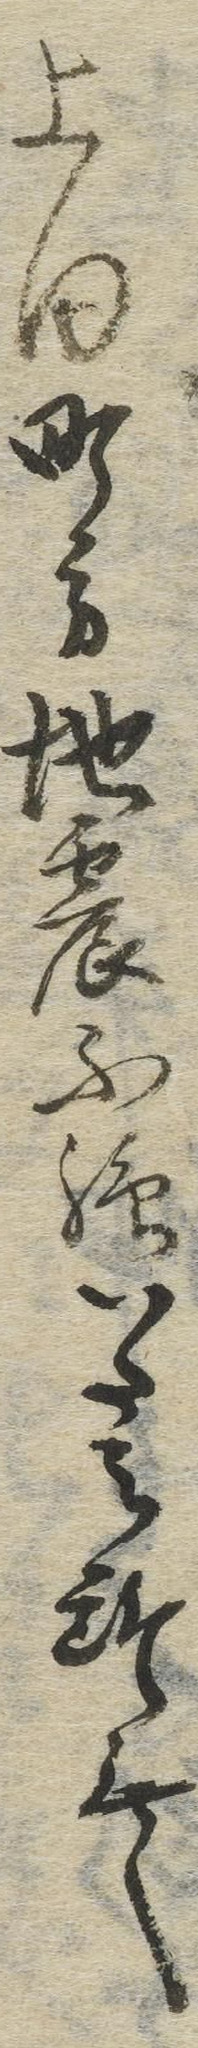上田町方地震不強いたミ所無之
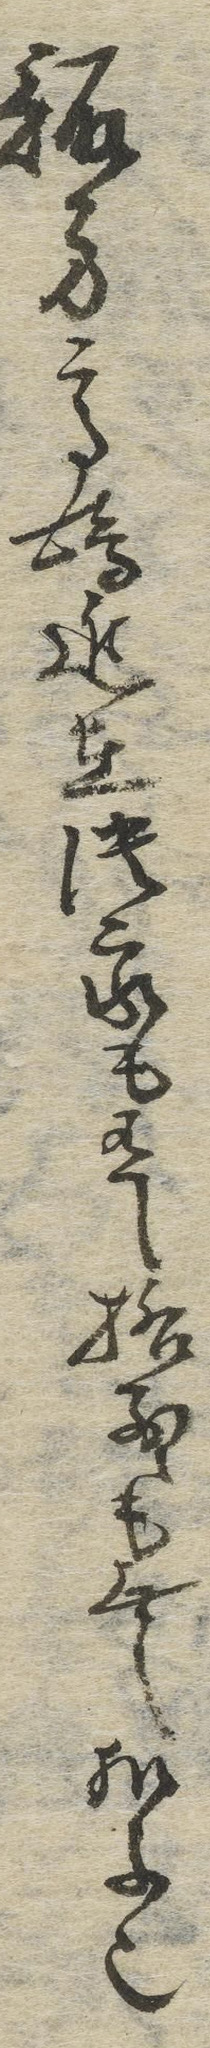諏方高嶋近在潰家も有之格別も無之様子也
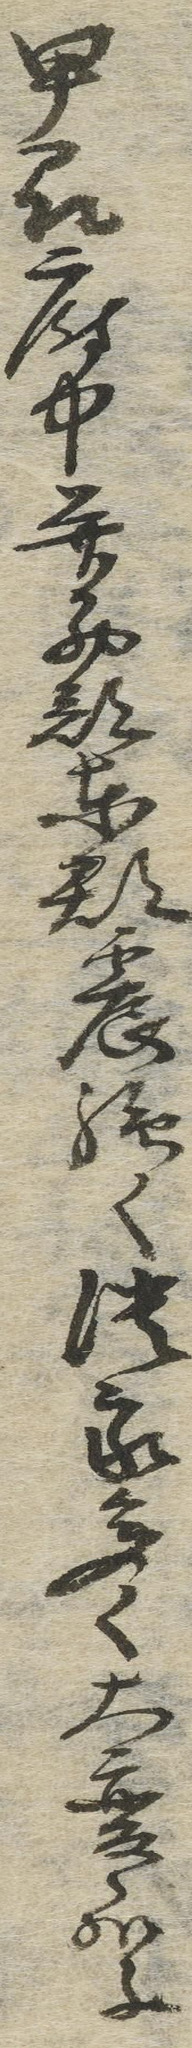甲州府中并西郡東郡震強く潰家多く大変之様子
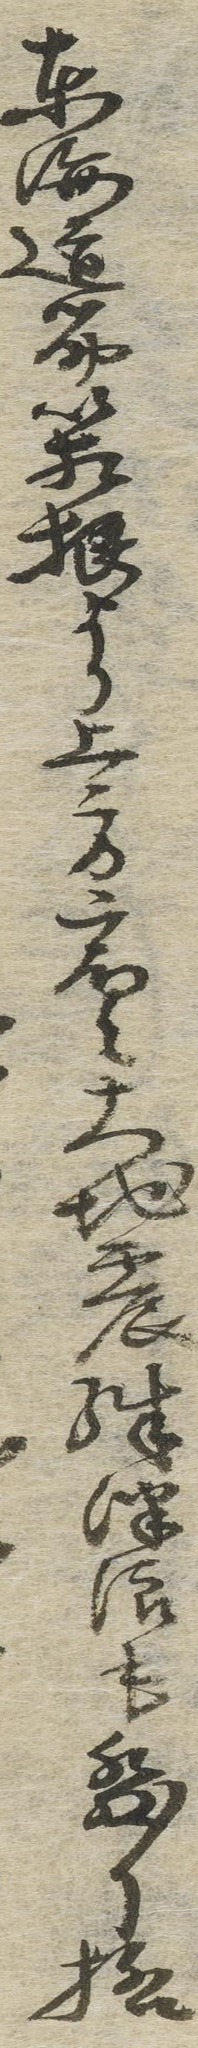東海道筋箱根より上方宿々大地震殊津浪も發り格
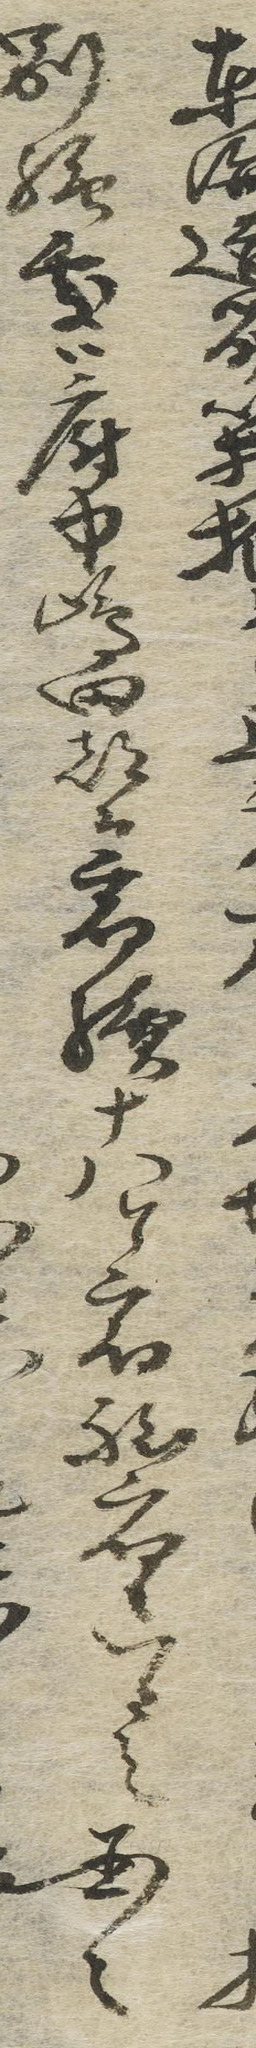別強処ハ府中嶋田都而宿損十八ヶ宿程宿々いたミ国々
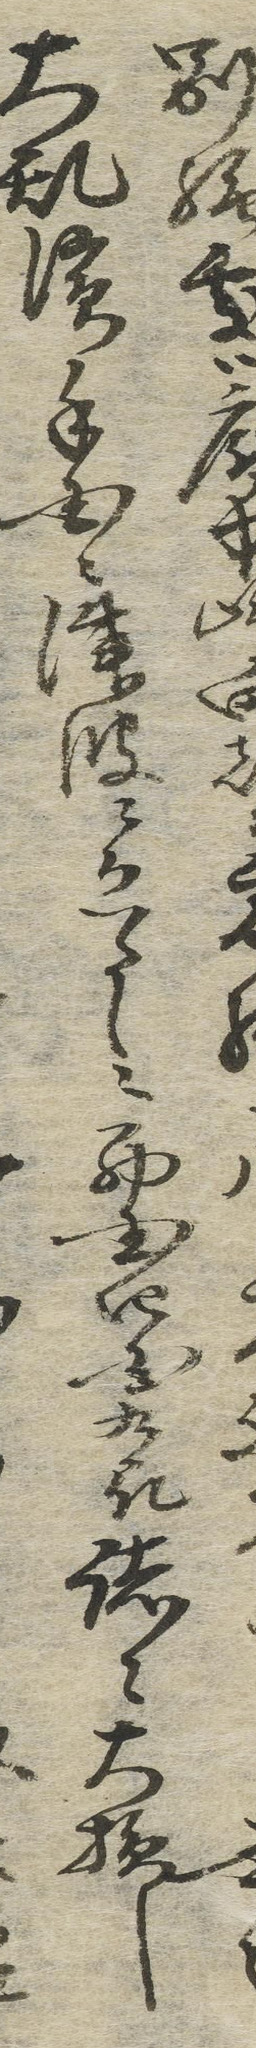大乱浜手年国々津波二而いたミ西国四国九州諸々大損し
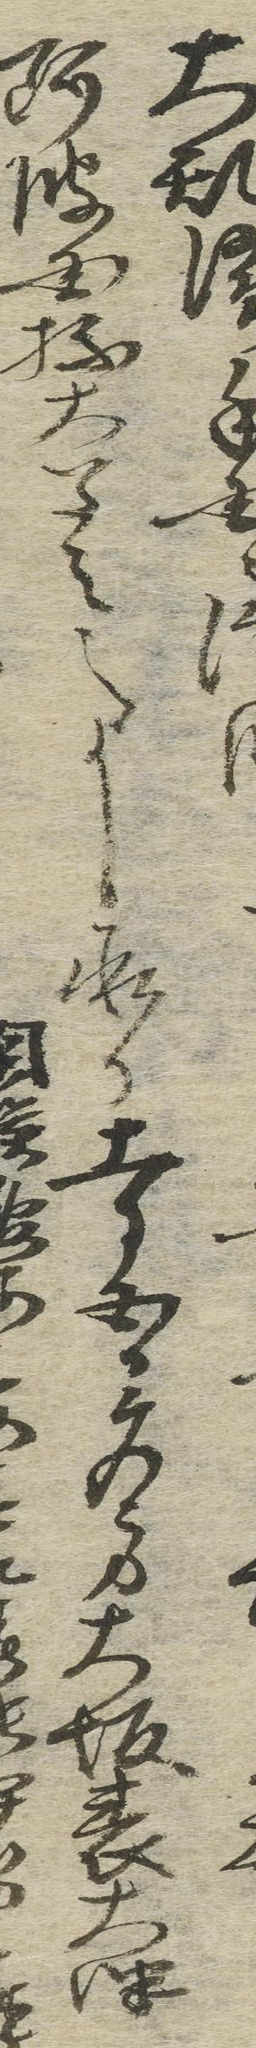阿波国抔大いたミ之候よし承り十一月五日夕方大坂表大津
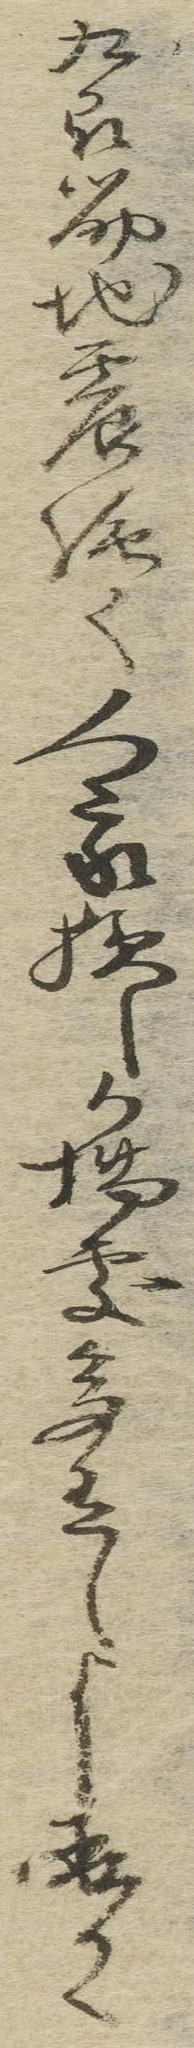九州筋地震強く人家損し候場処多有之候よし承り候
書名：信濃越後　地震書留
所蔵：東京大学地震研究所図書室 Earthquake Research Institute Library, The University of Tokyo, JAPAN
